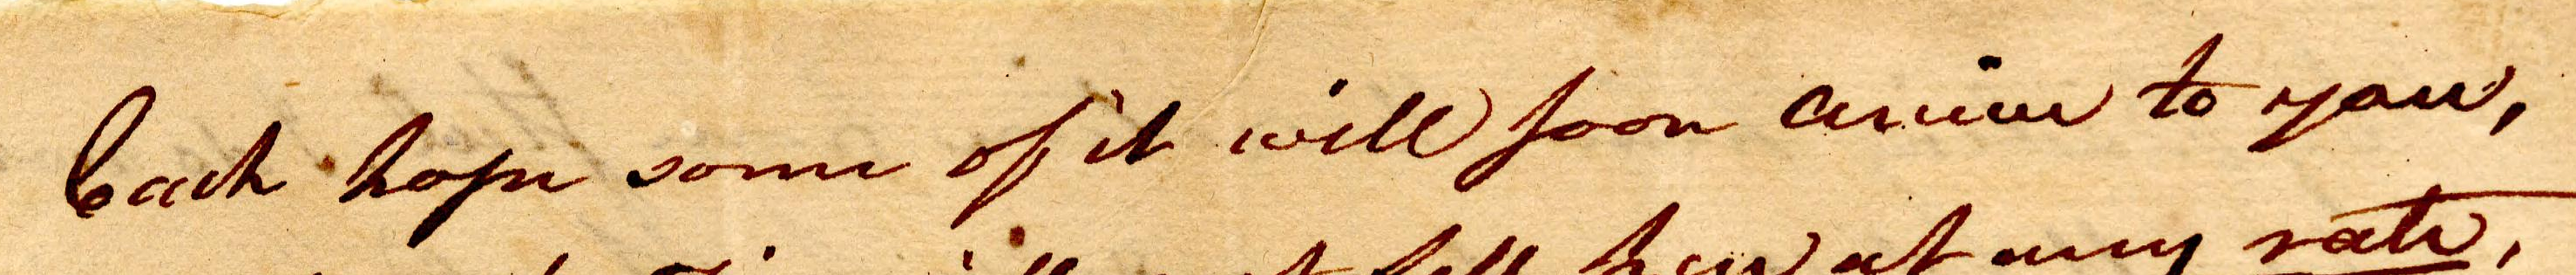Cash hope some of it will soon arrive to you,
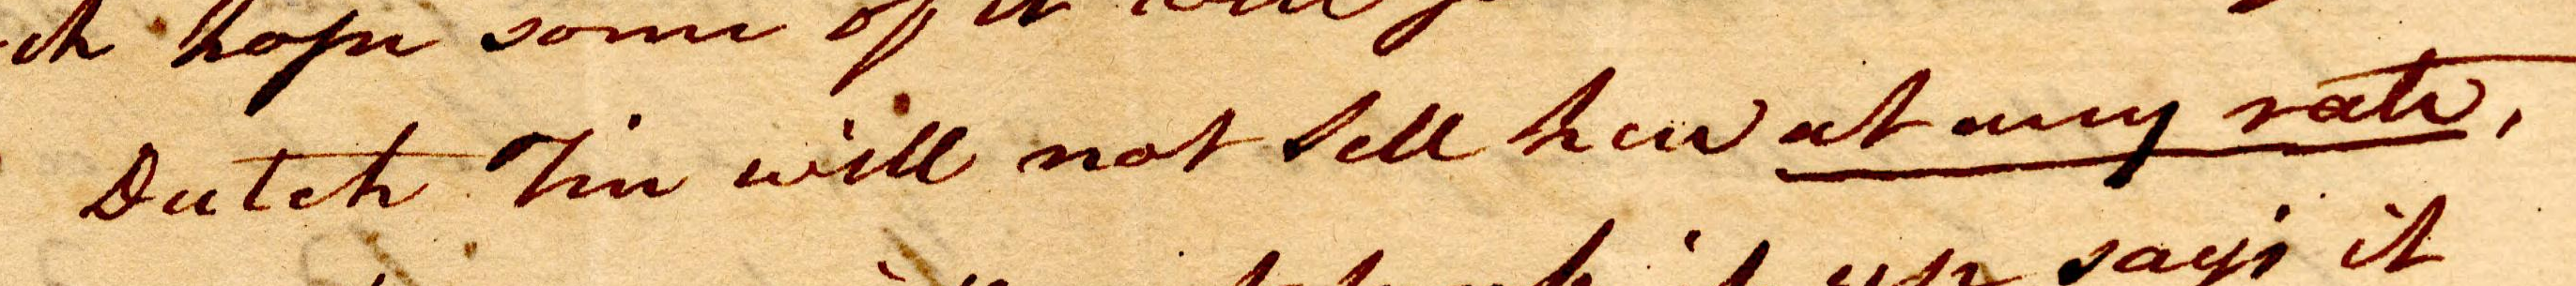Dutch Tin will not sell here at any rate,
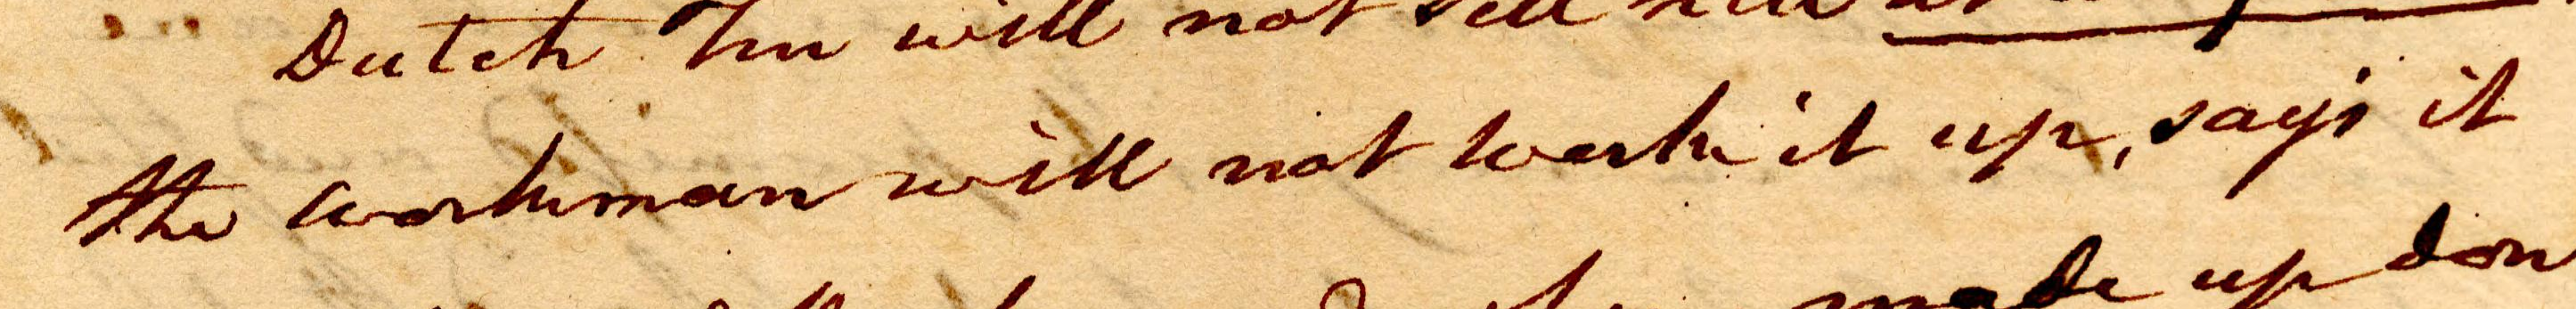the workman will not work it up, say's it
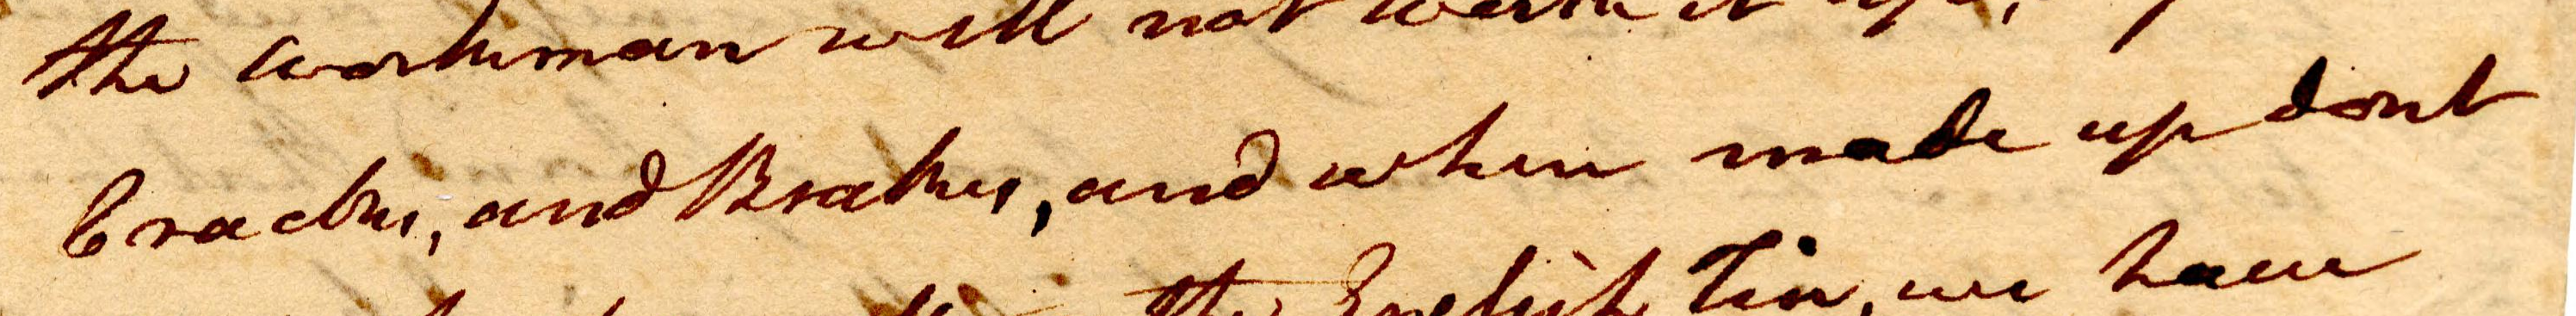Crackes, and Brakes, and when made up dont
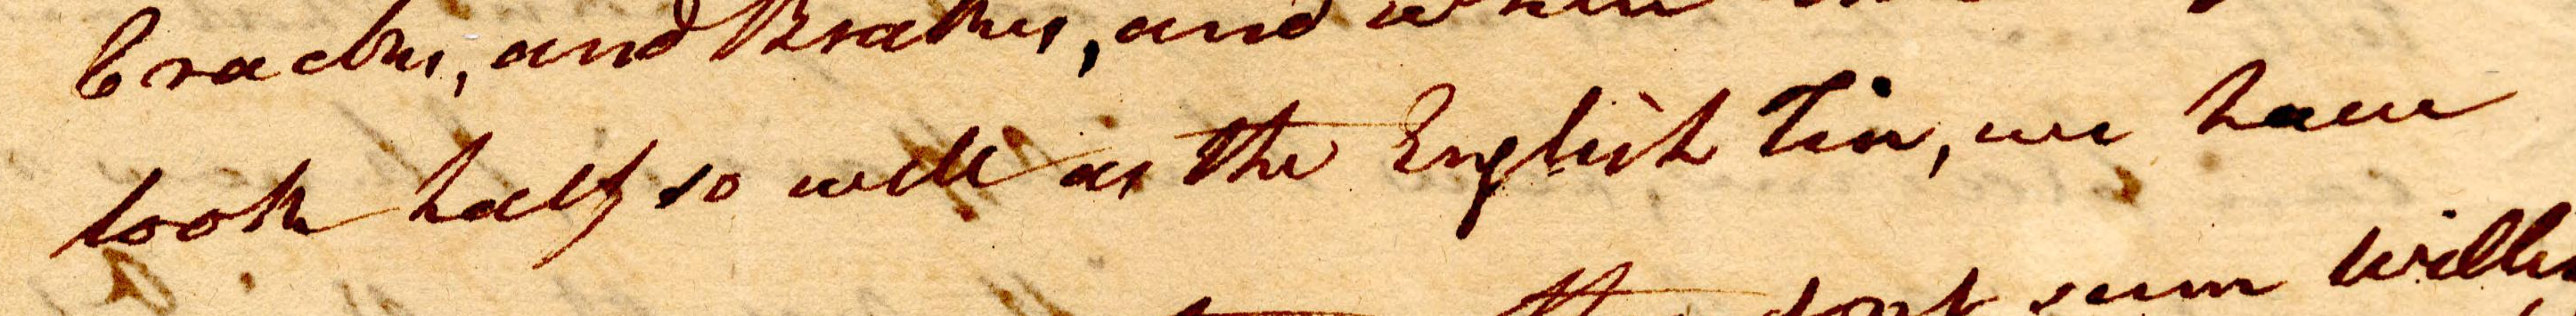took half so well as the English Tin, we have
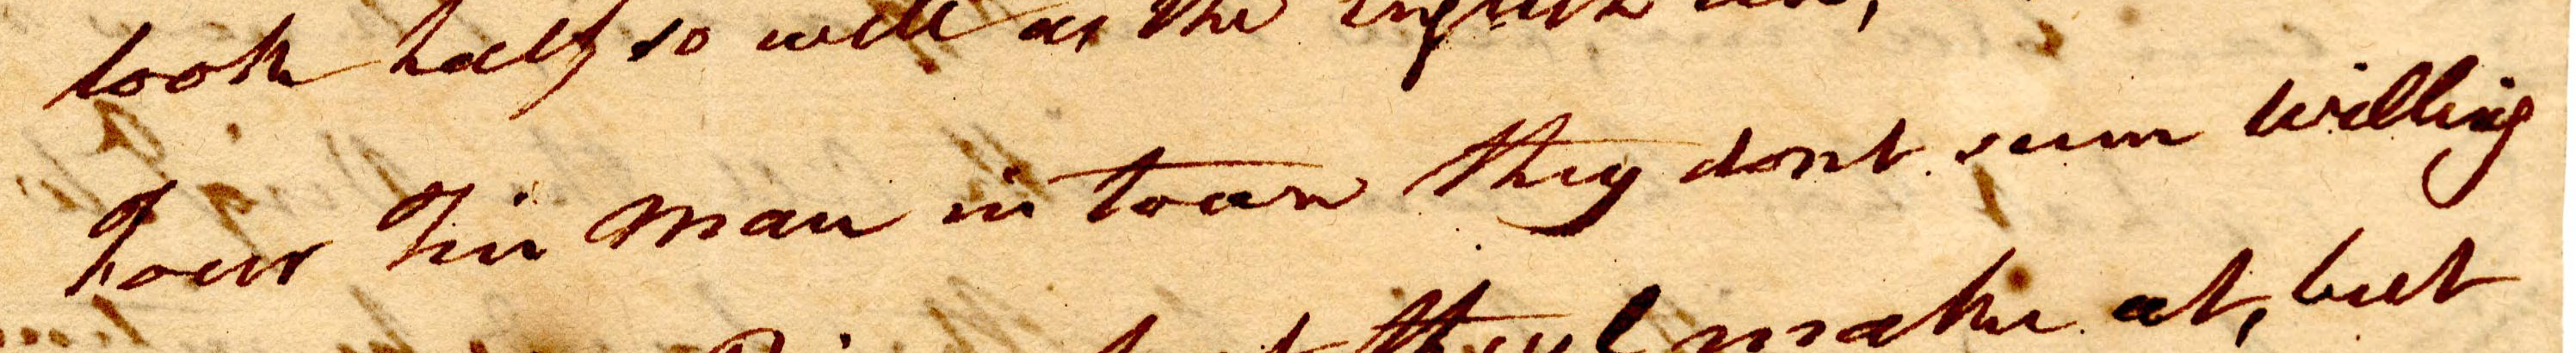Four Tin man in town they dont seem willing
